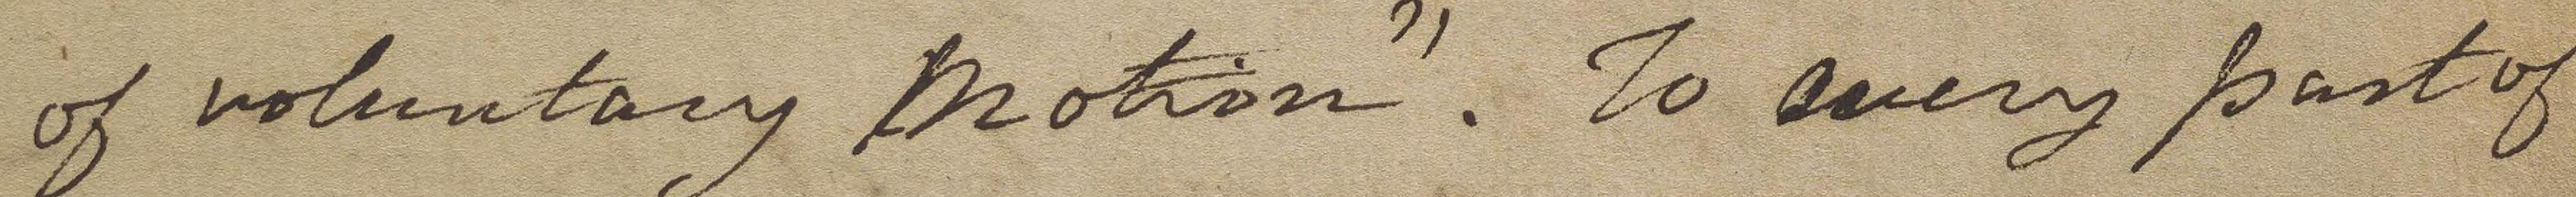of voluntary motion. To every part of
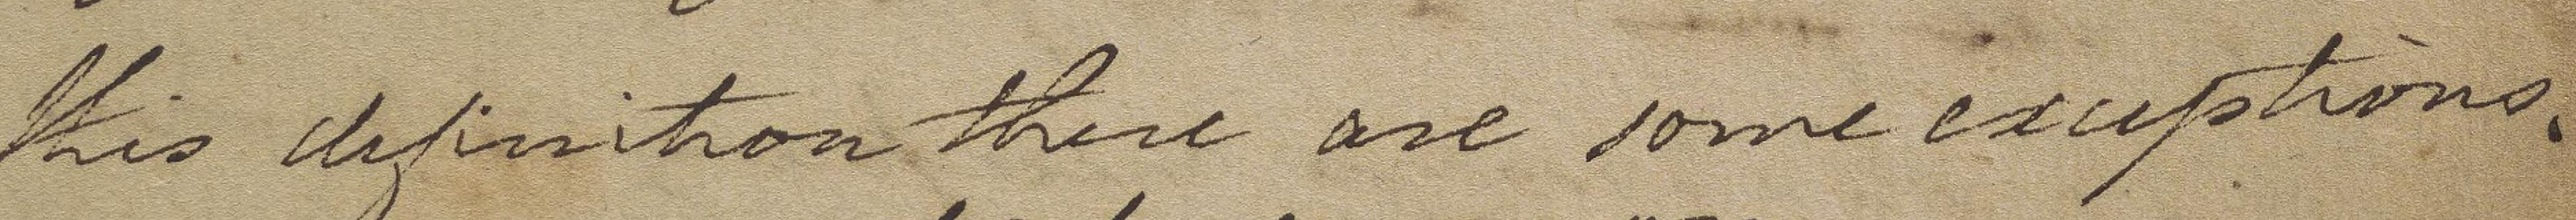this definition there are some exceptions
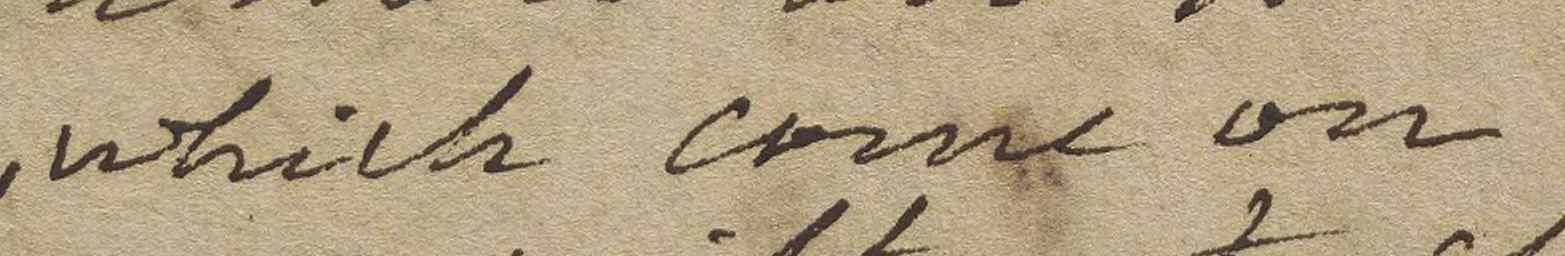which come on
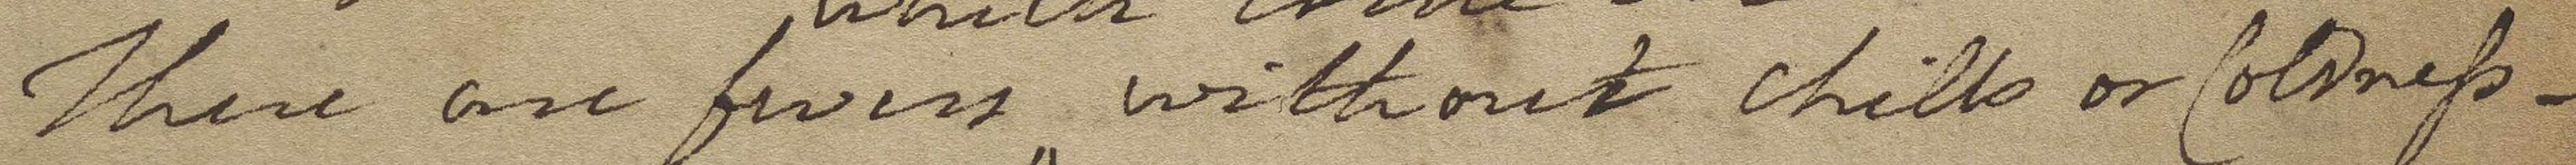there are fevers ^ without chills or coldness-
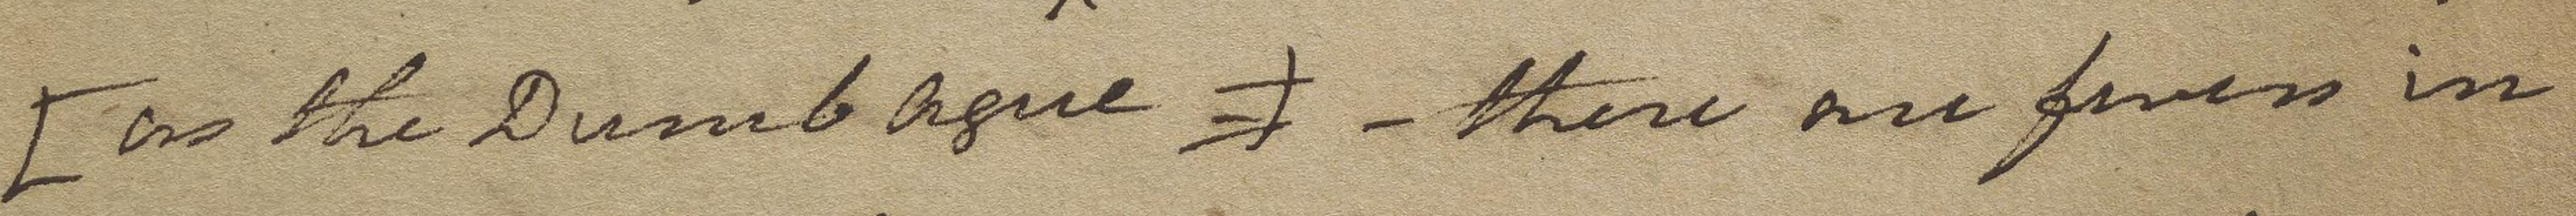(as the dumb ague)- there are fevers in
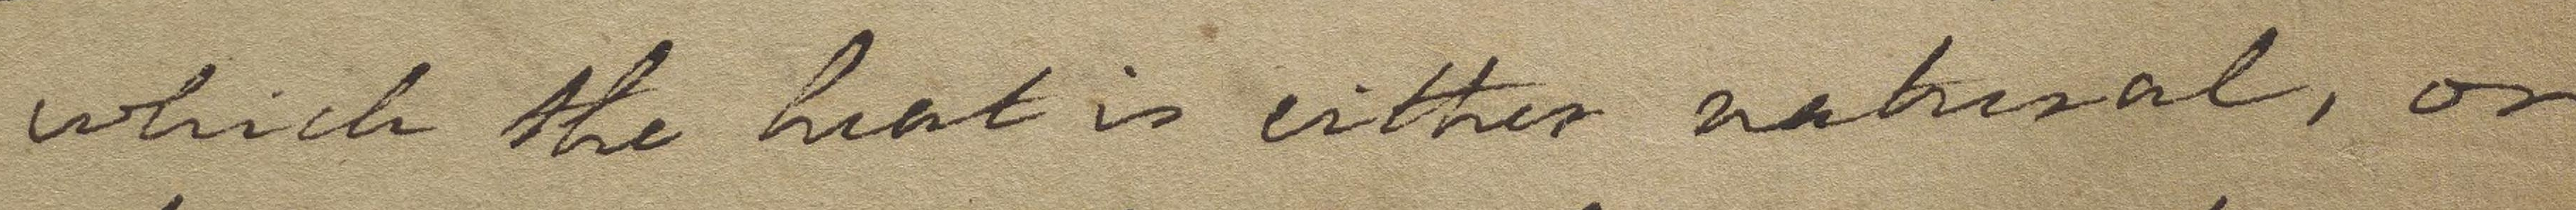which the heat is either natural, or
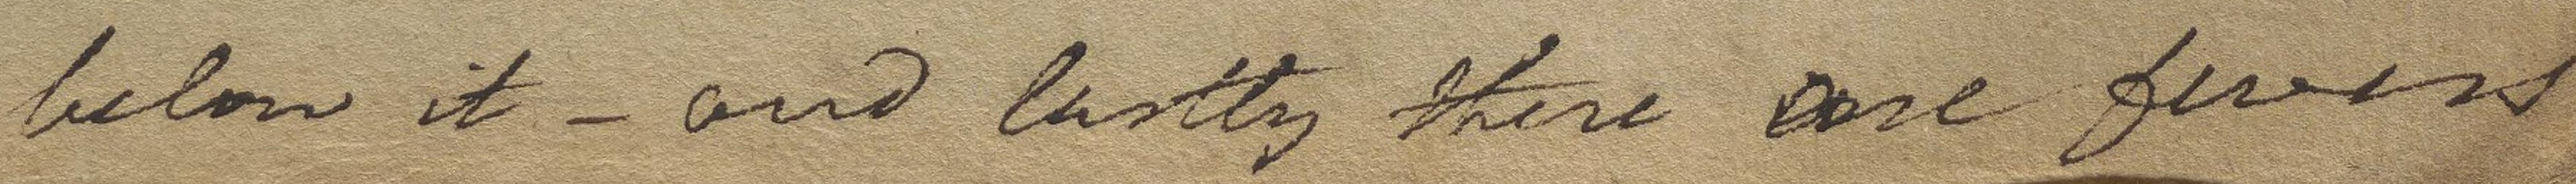below it, and lastly there are fevers
